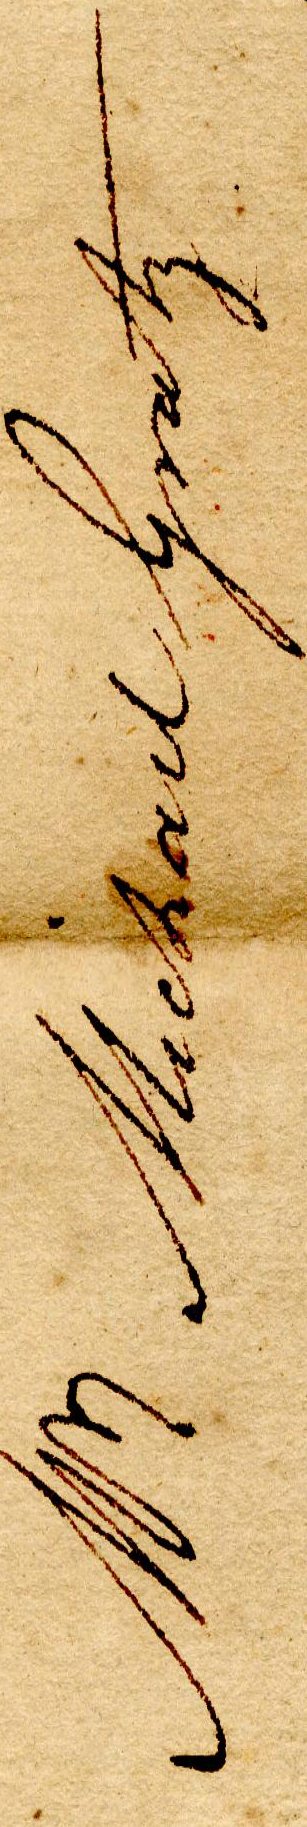M^r Michael Gratz
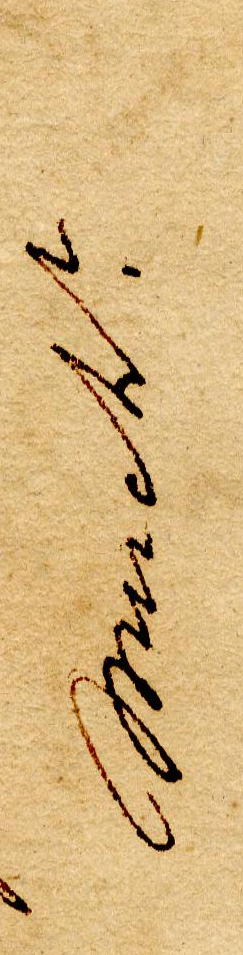Merch^t
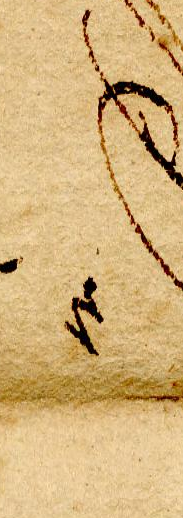In
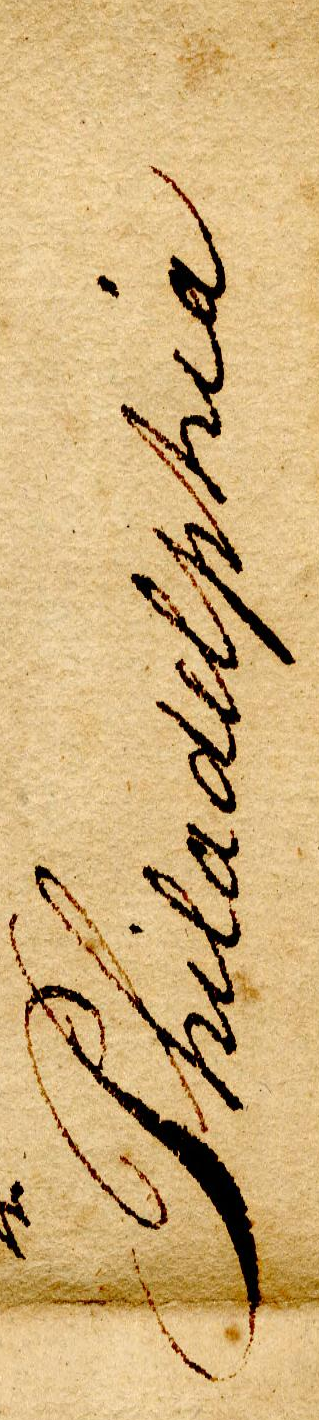Philadelphia
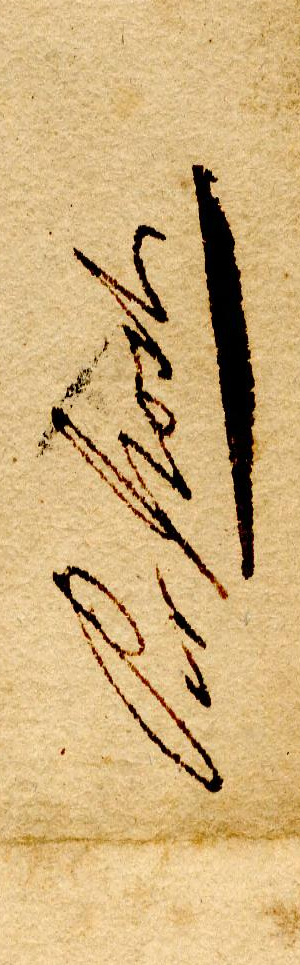Per post
